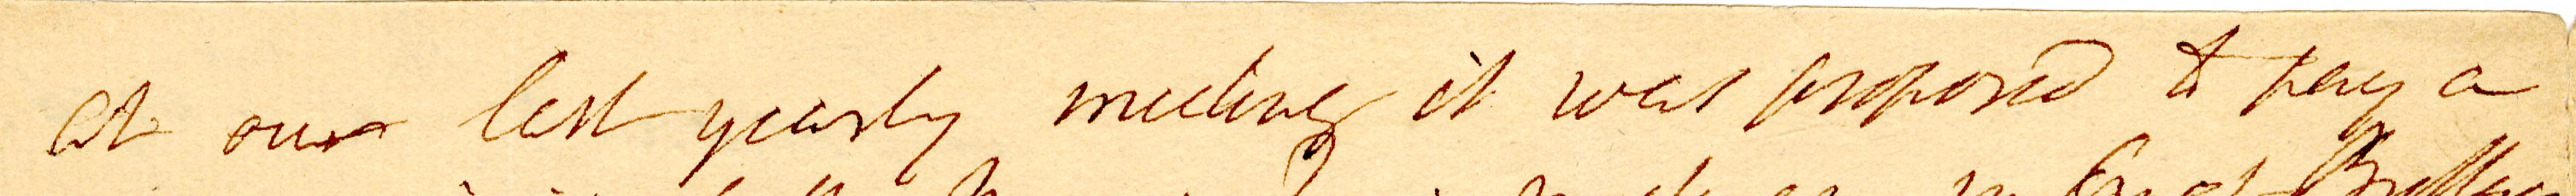At our last yearly meeting it was proposed to pay a
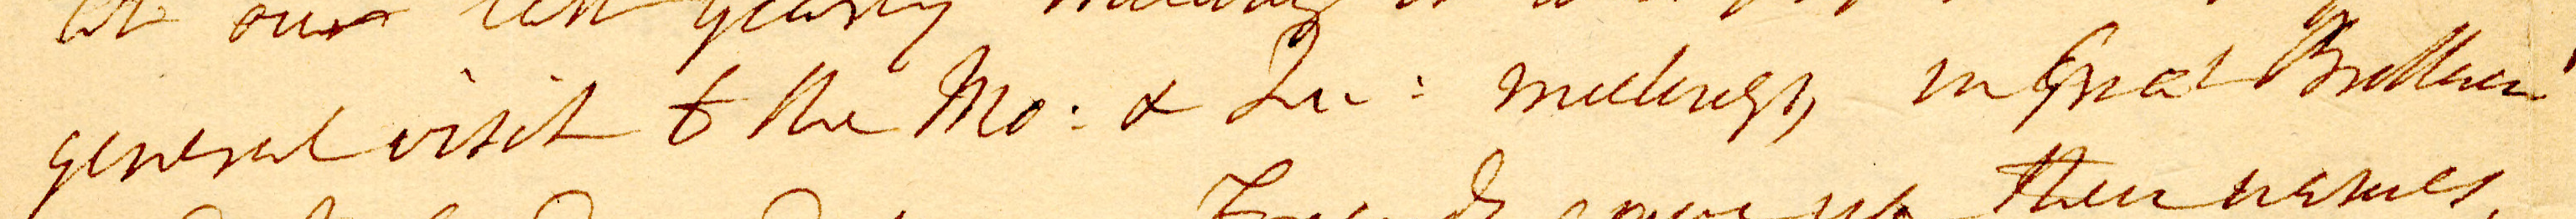general visit to the Mo: & Qu: meetings, in Great Britain
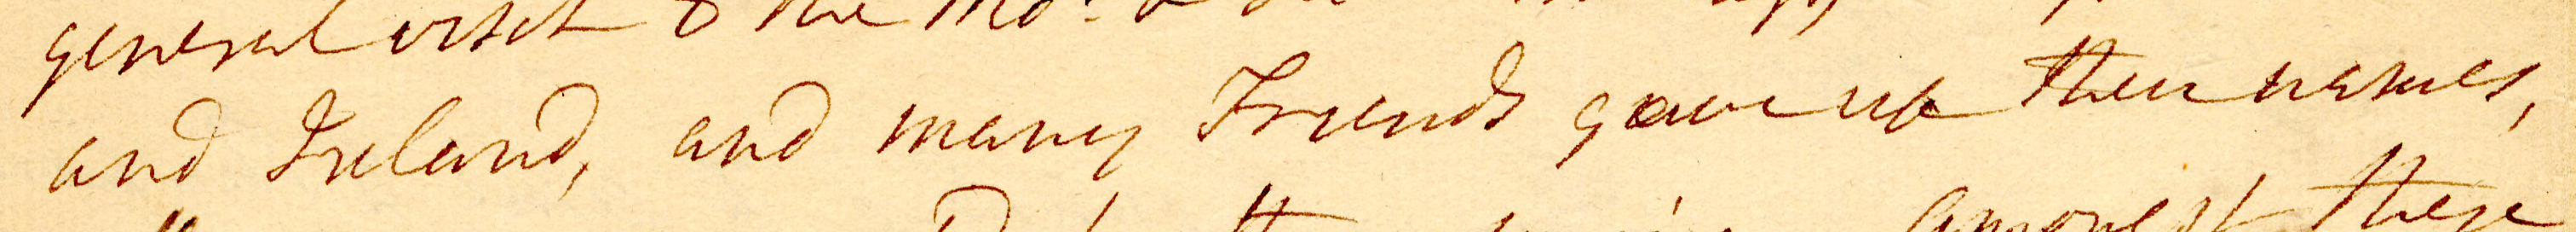and Ireland, and many Friends gave us their names,
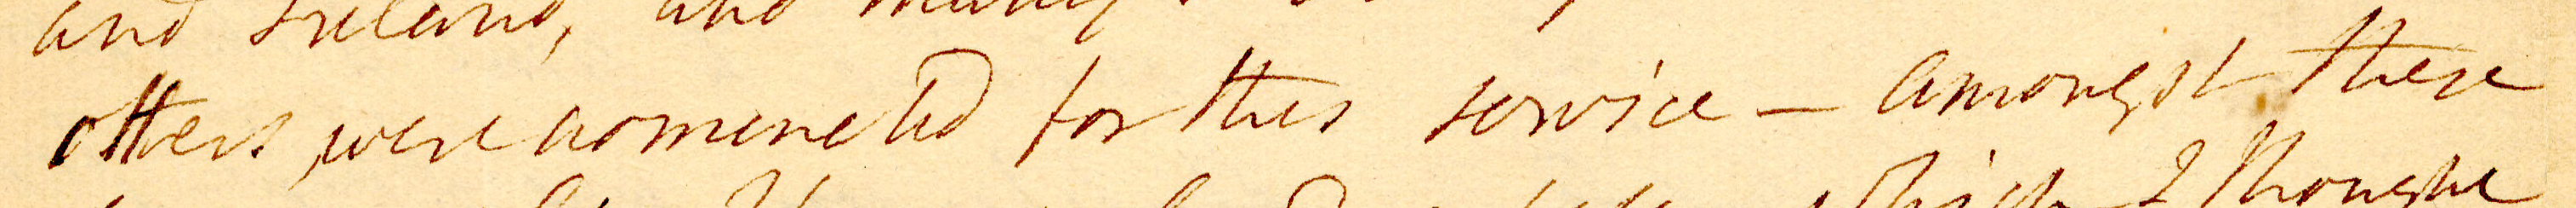others were nominated for this service- Amongst these
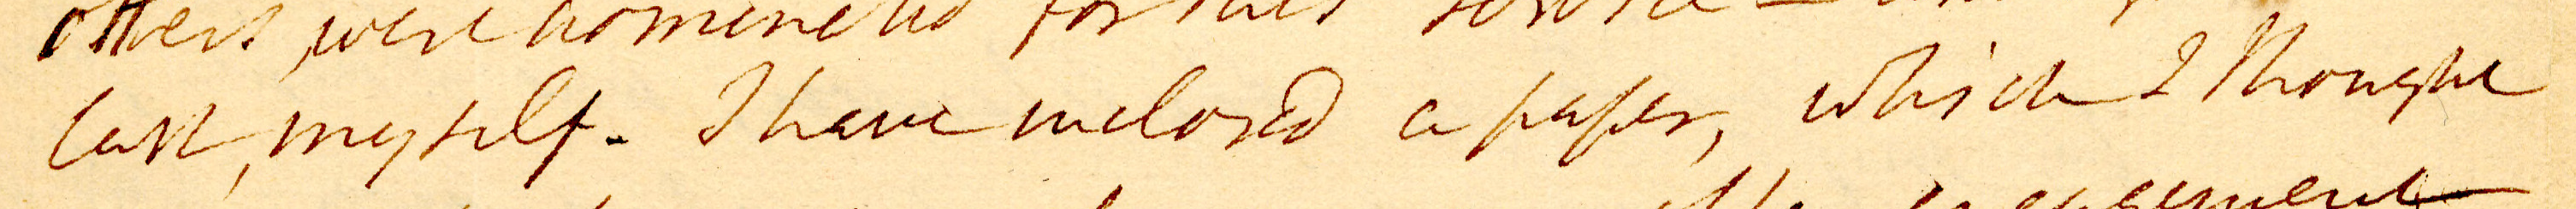last, myself. I have inclosed a paper, which I thought
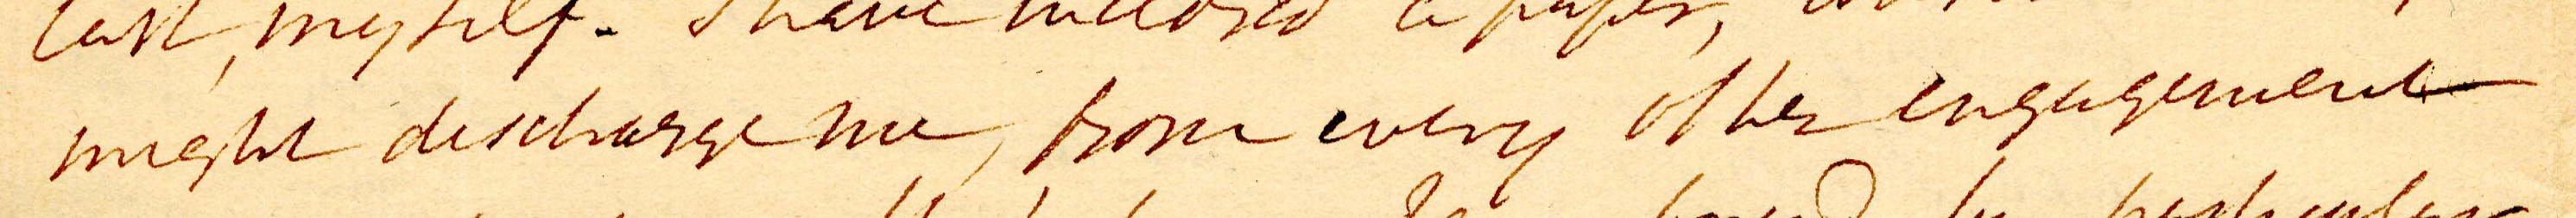might discharge me from every other engagement
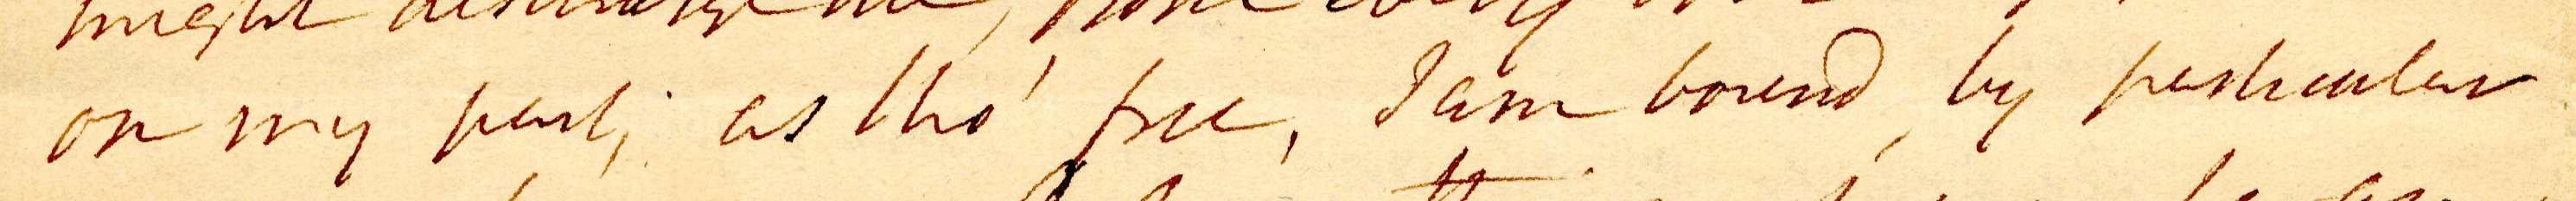on my part; as tho' fre, I am bound by particular
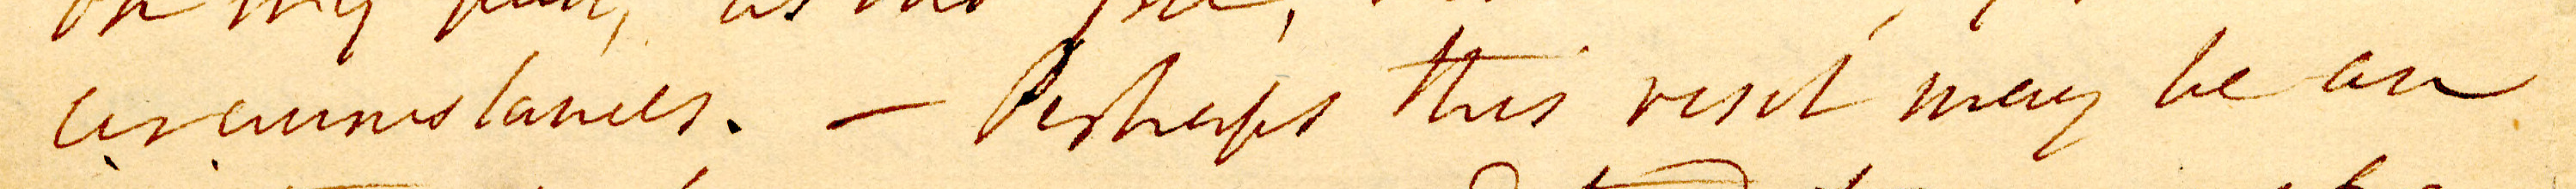circumstances.- Perhaps this visit may be an
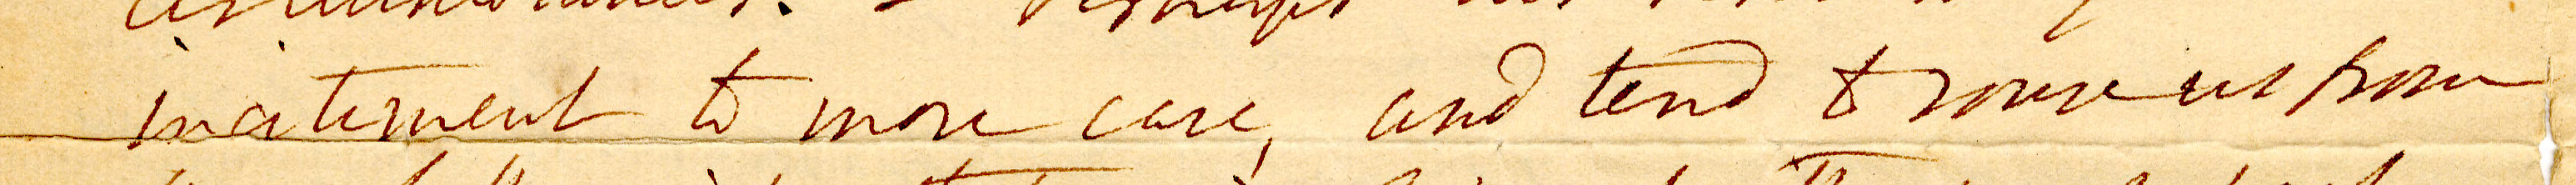incitement to more care, and tend to move us from
